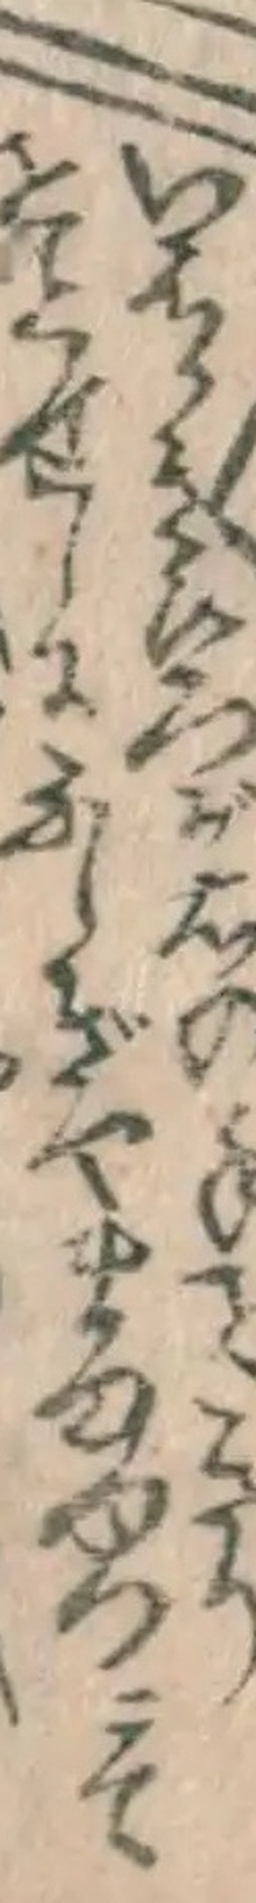おとせしにふしぎやまし？ゆつにて
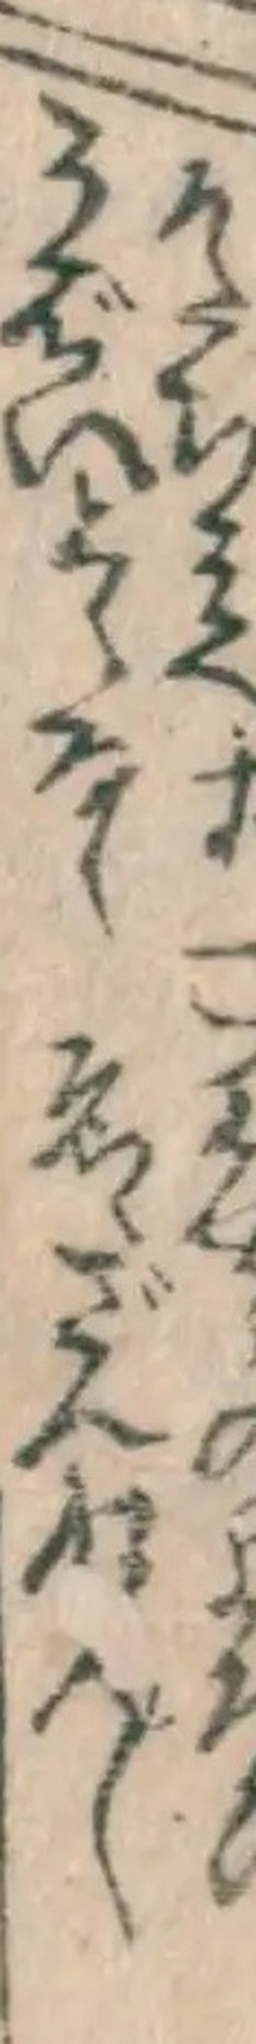うばいとらるゝゑゝざんねん〳〵

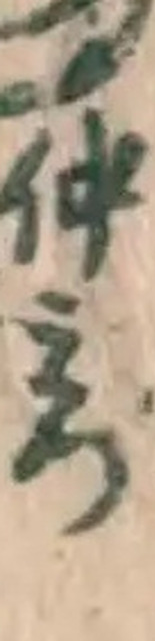仲みつ
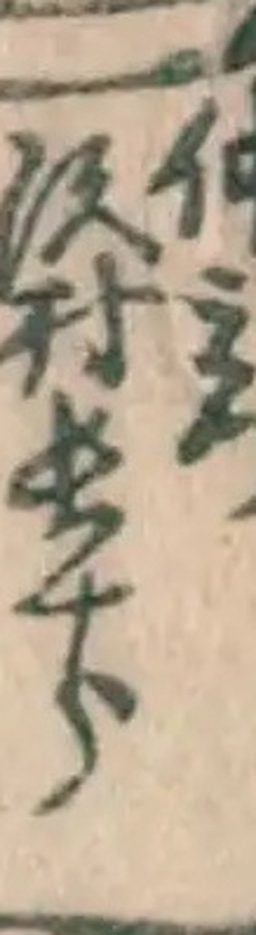沢村長十郎
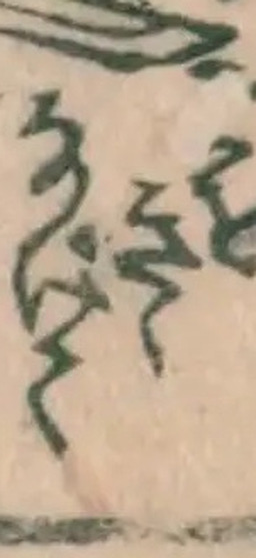なげく
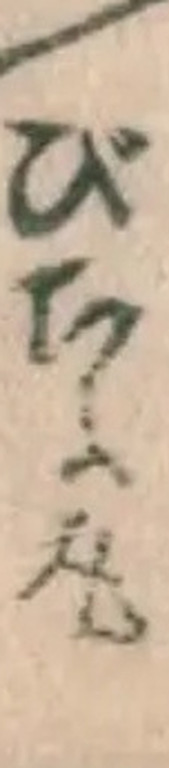びちよ丸
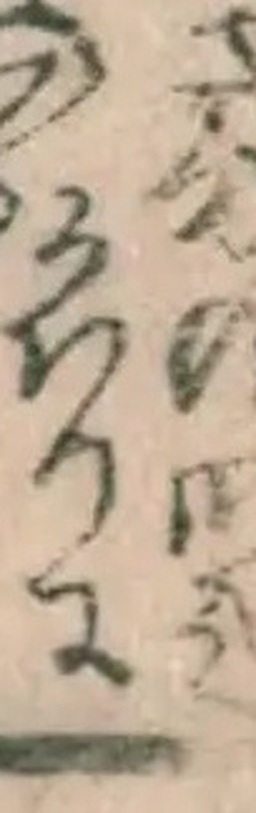かはりに
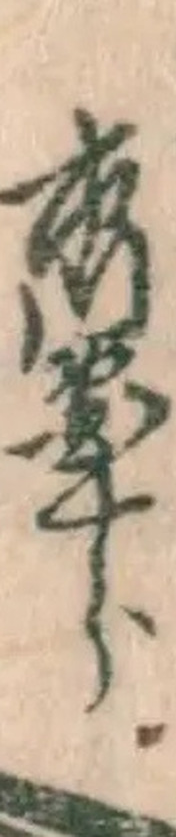市川団十郎
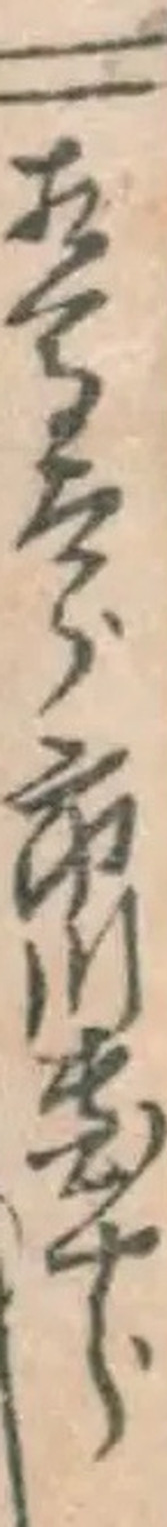相馬太郎市川団十郎
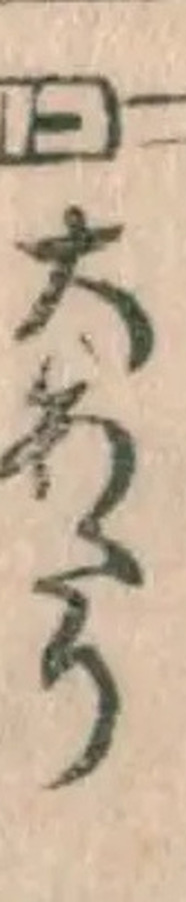大あたり
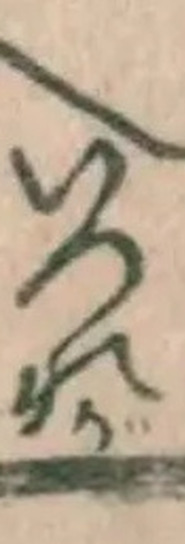いつれが
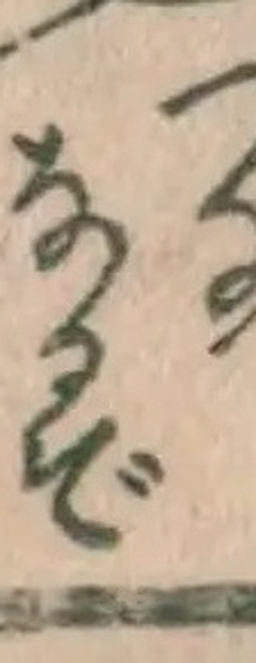なるぞ
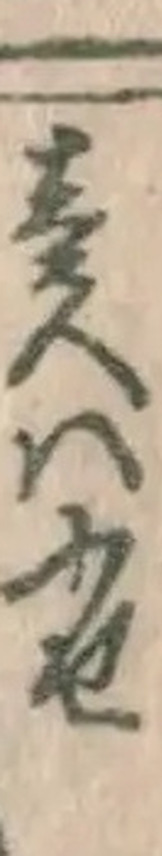壱人はにせ
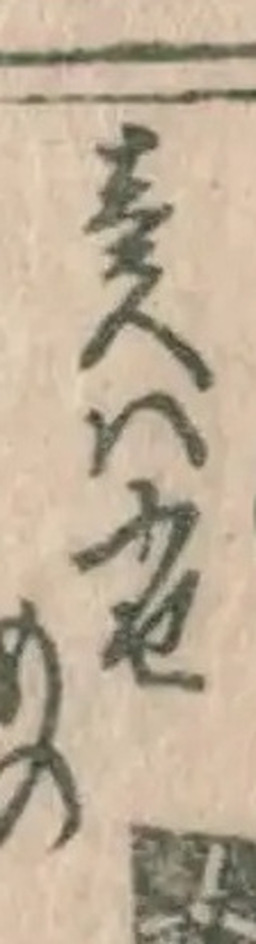壱人はにせ
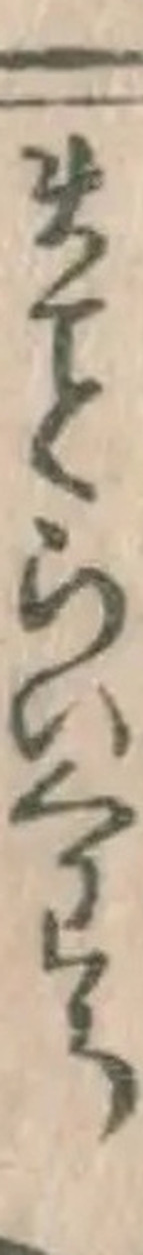まことらいくわう
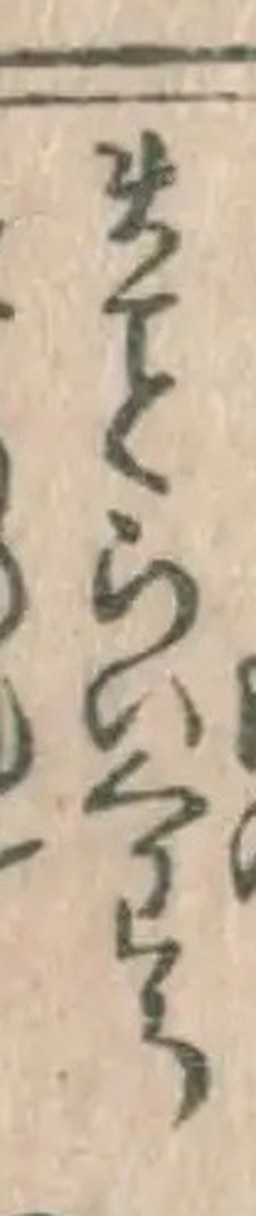まことらいくわう
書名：菊慈童酒宴岩窟
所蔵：国立国会図書館 National Diet Library, JAPAN
